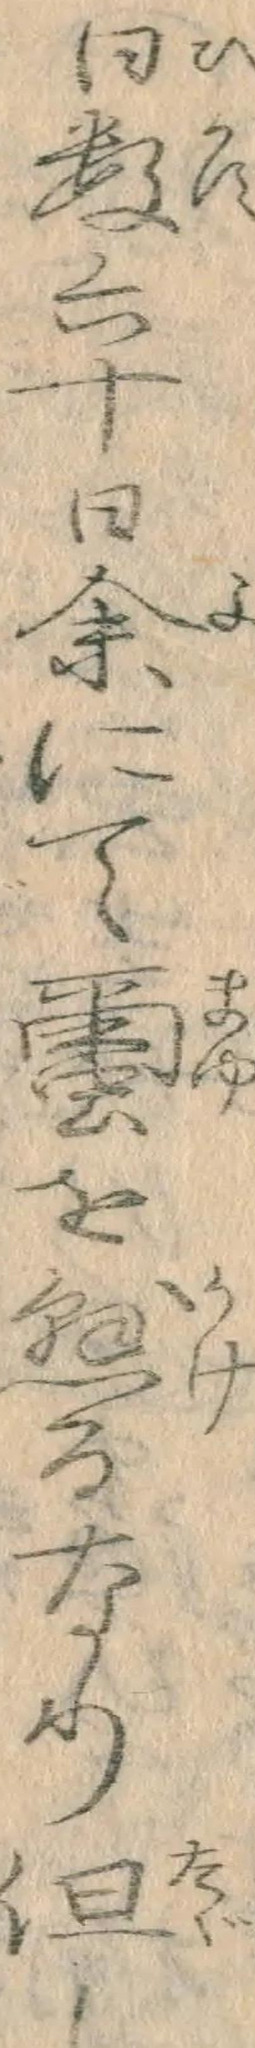日数六十日余にて繭を懸るなり但し寒國暖
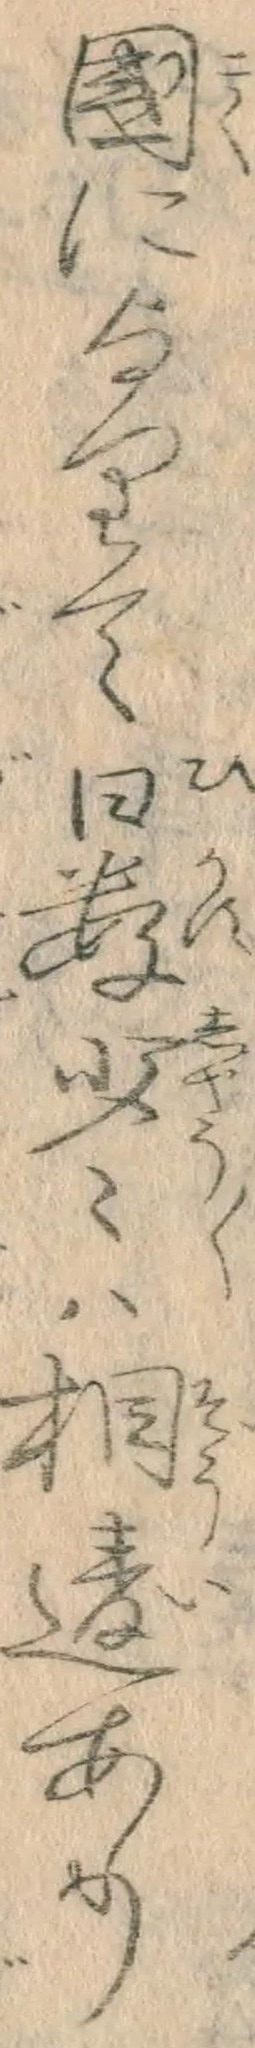國によりて日数少々は相違あり
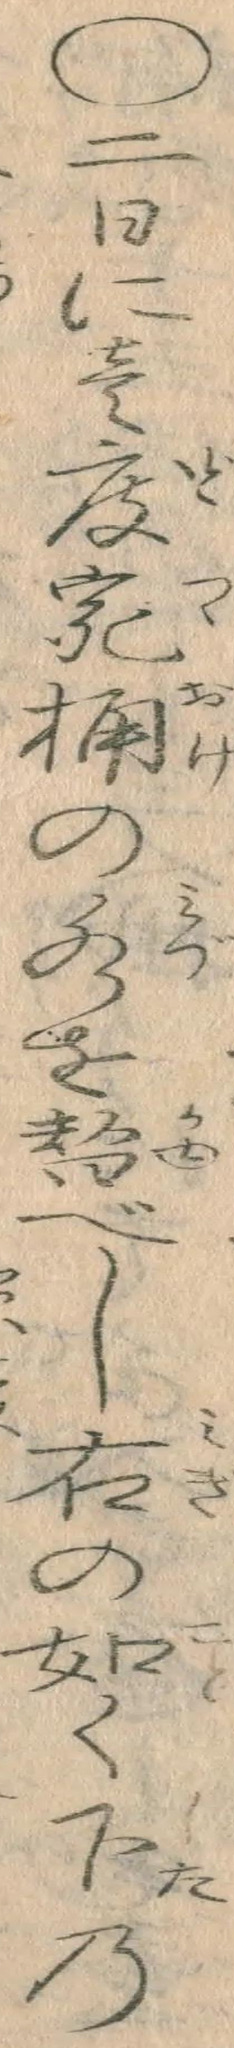○二日に壱度宛桶の水を替べし右の如く下の
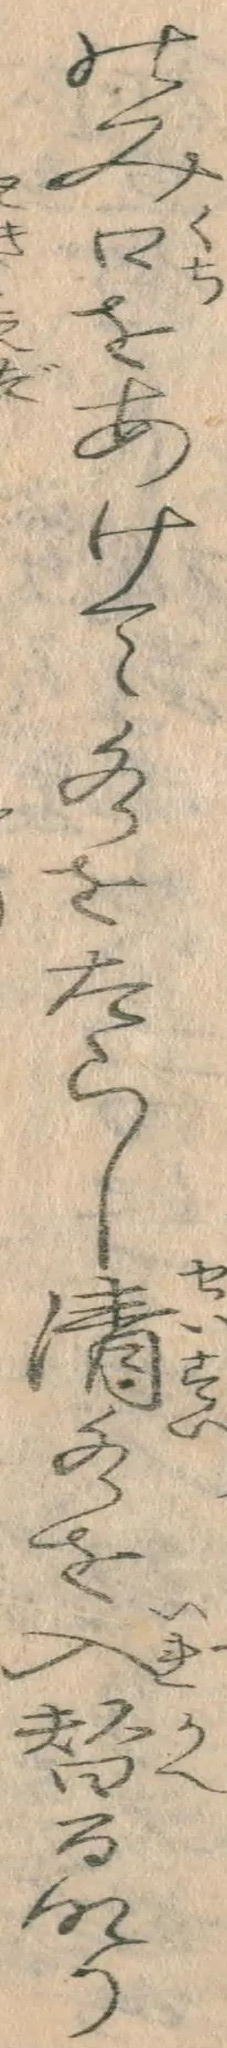のみ口をあけて水をたらし清水を入替るなり
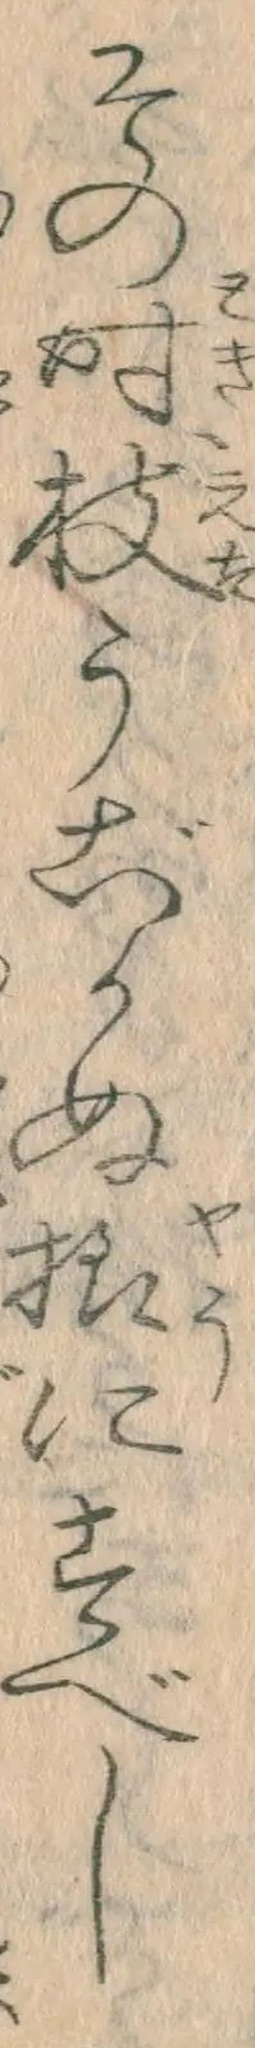その時枝うごかぬ様にすべし
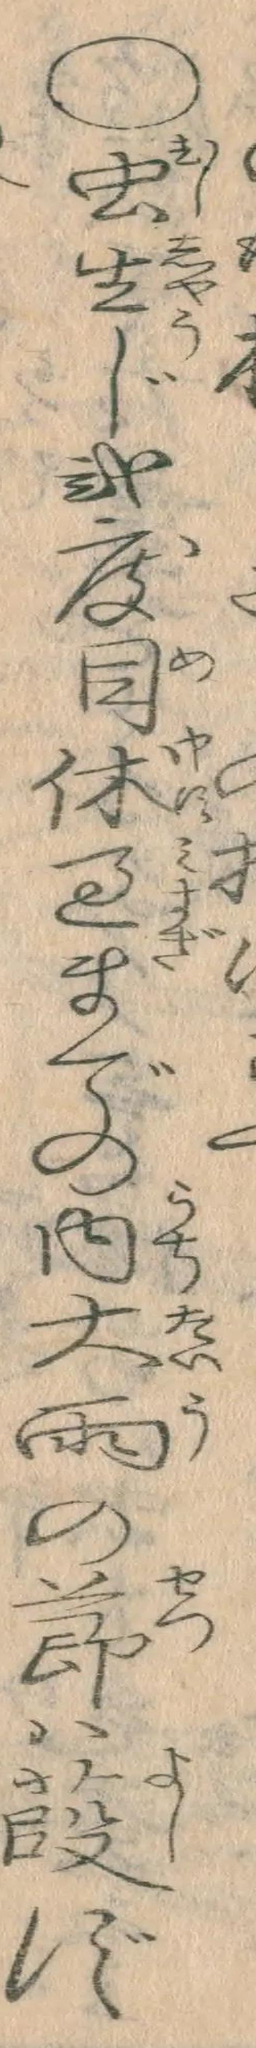○虫生じ弐度目休過までの内大雨の節は葭ず
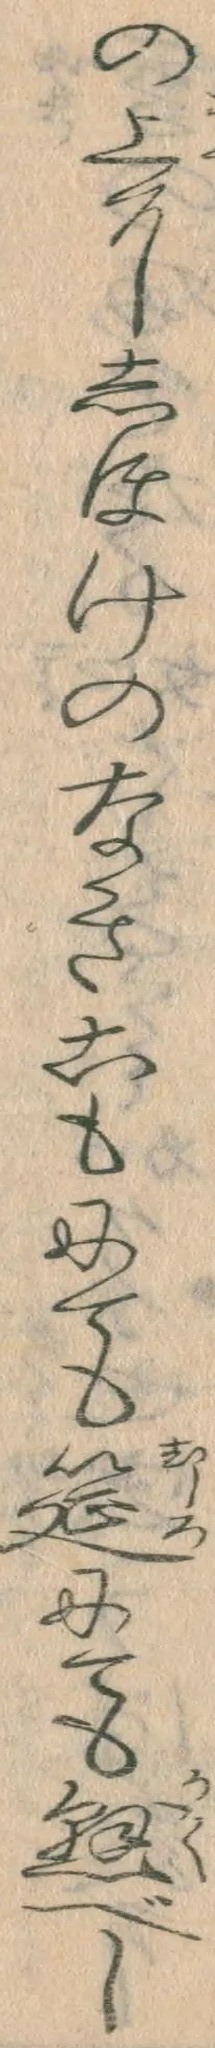の上にしほけのなきこもにても筵にても懸べし
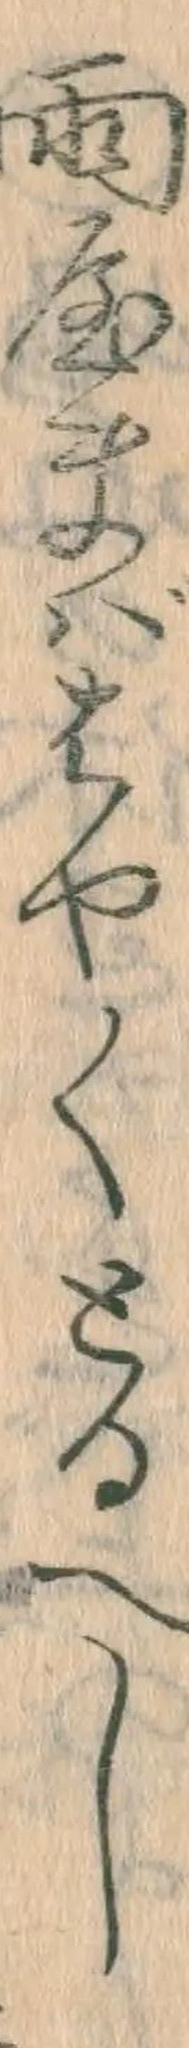雨屋まばはやくとるへし
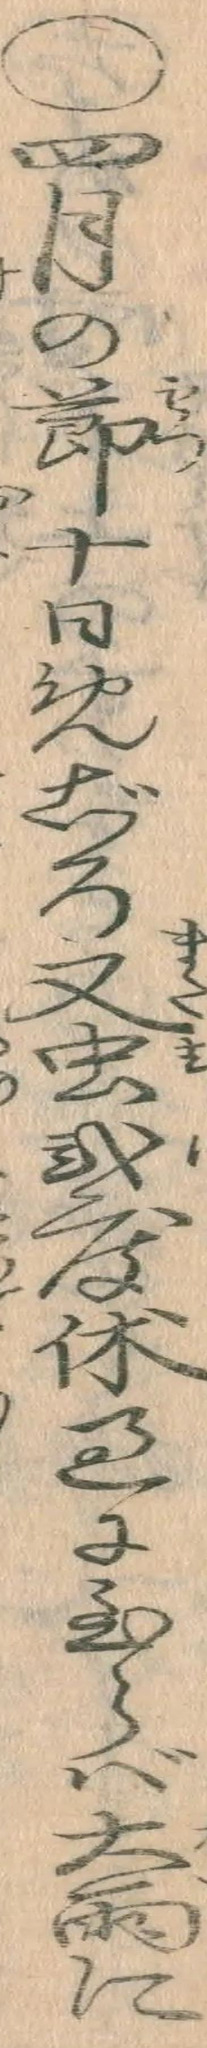○四月の節十日めごろ又虫弐度休過尓至らば大雨に
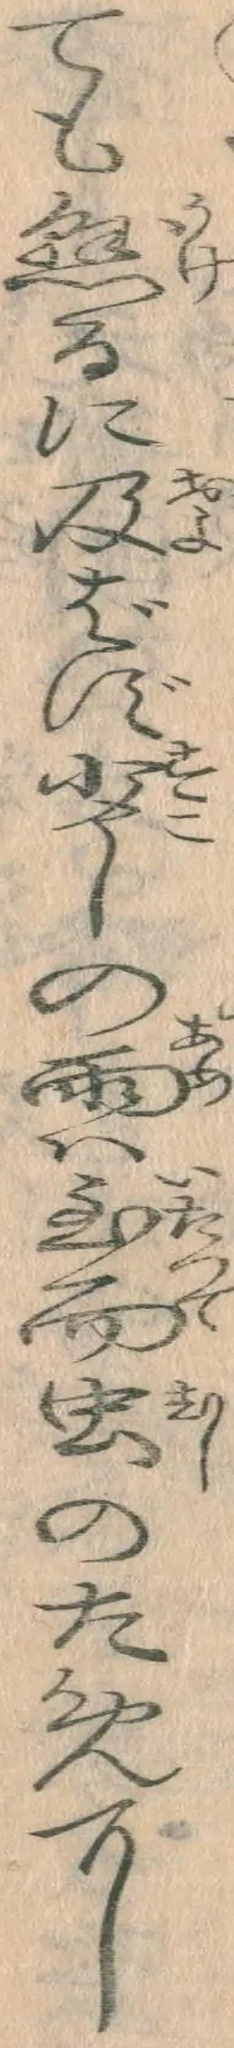ても懸るに及ばず少しの雨は至而虫のために
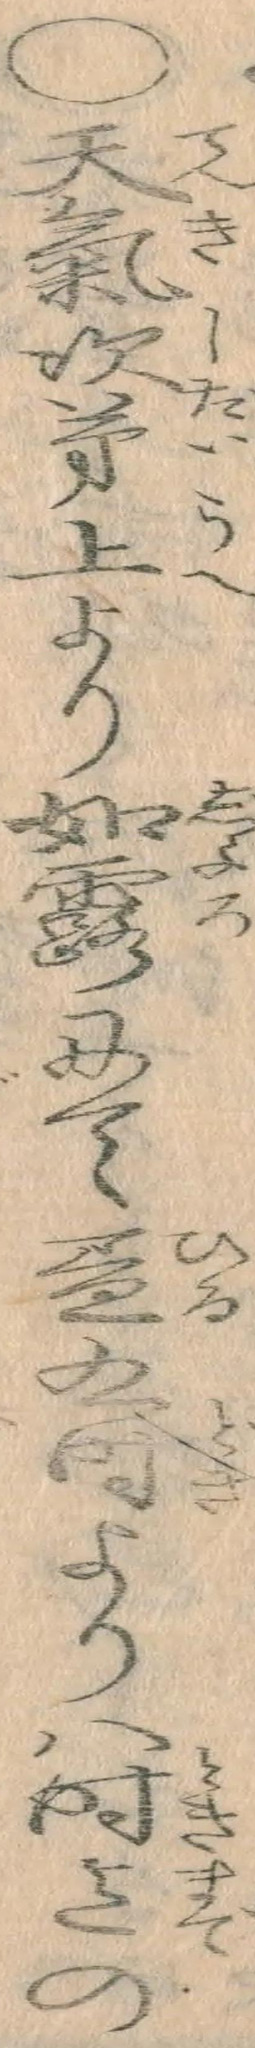○天気次第上より如露にて昼九時より八時迄の
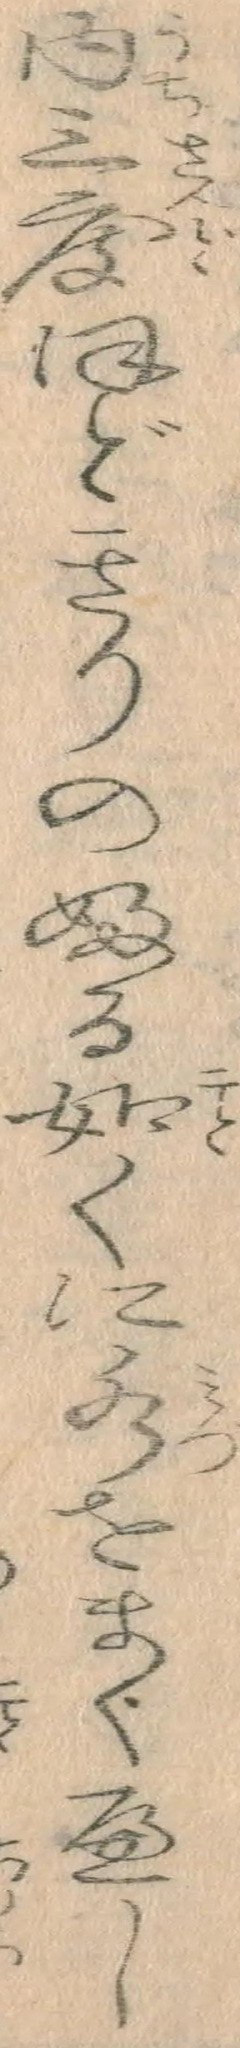内三度ほどきりのふる如くに水をまくへし
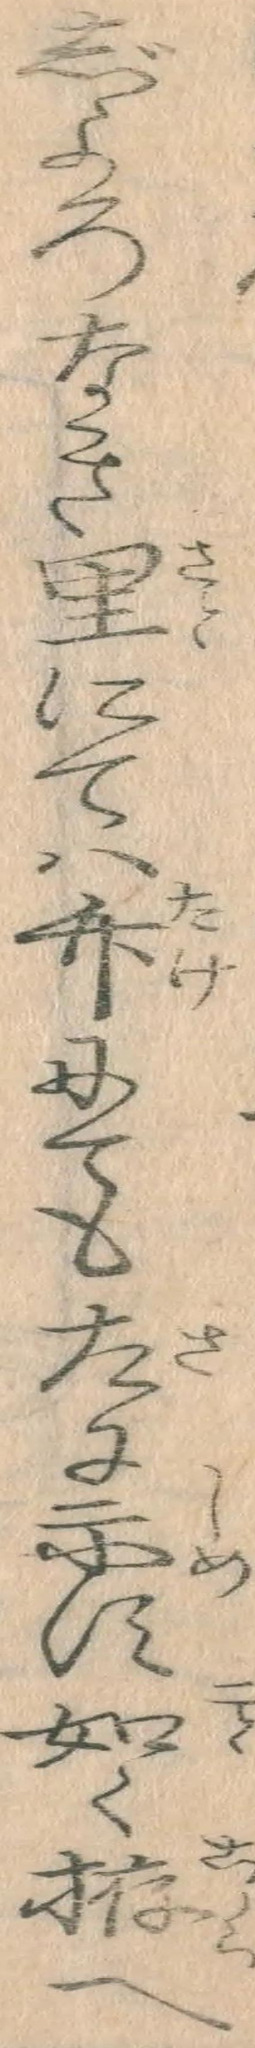じよろなき里にては竹にても左に示す如く拵へ
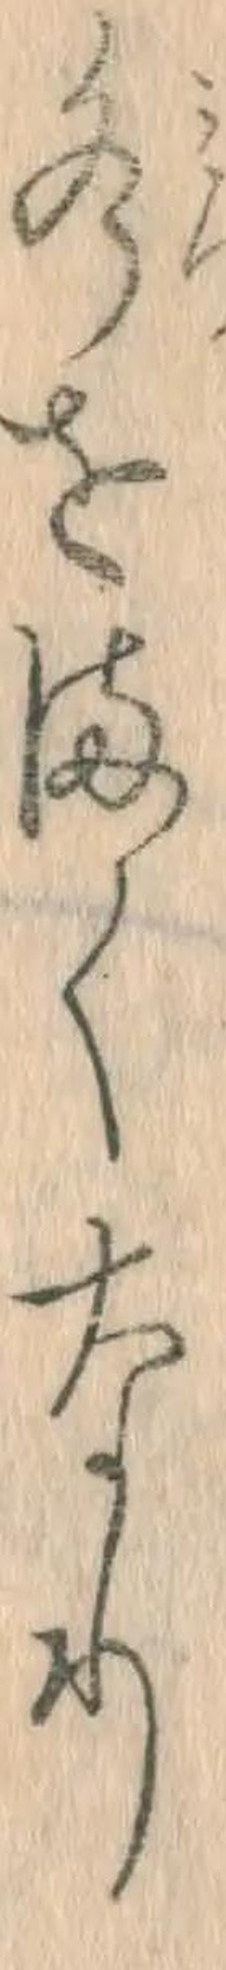水を満くなり

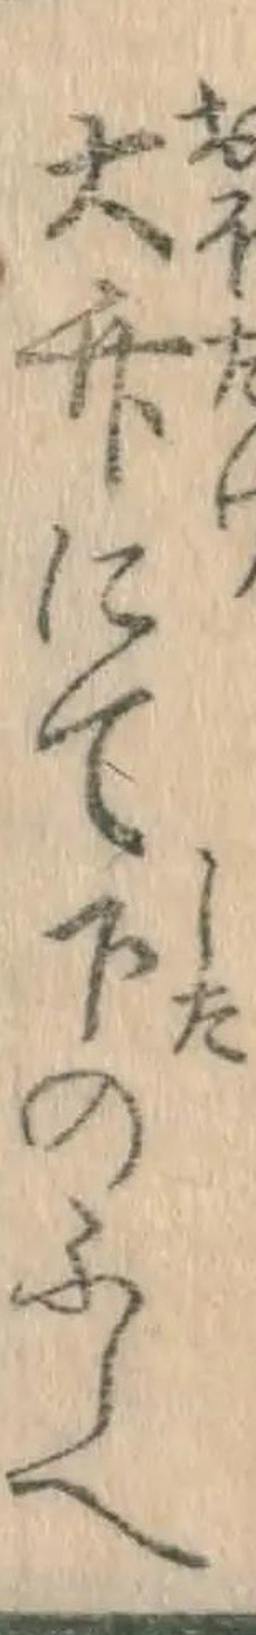大竹にて下のふしへ
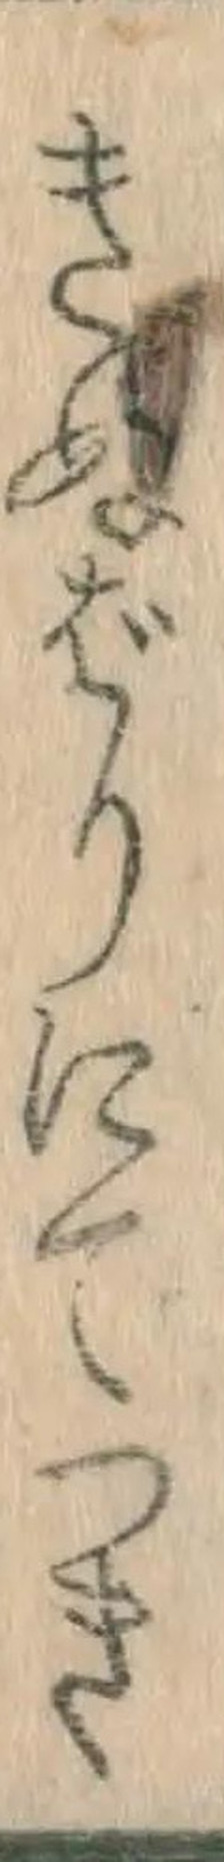きぬばりにてつき
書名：山繭養法秘傳抄
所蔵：国立国会図書館 National Diet Library, JAPAN
